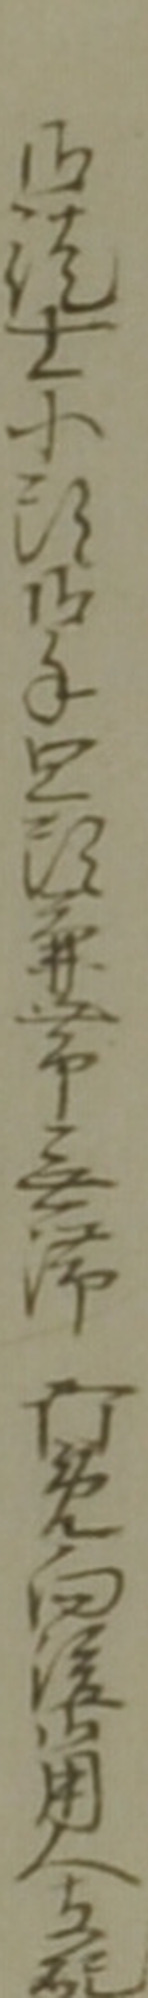御徒士小頭御手廻頭兼帯無滞御免向後御用人支配
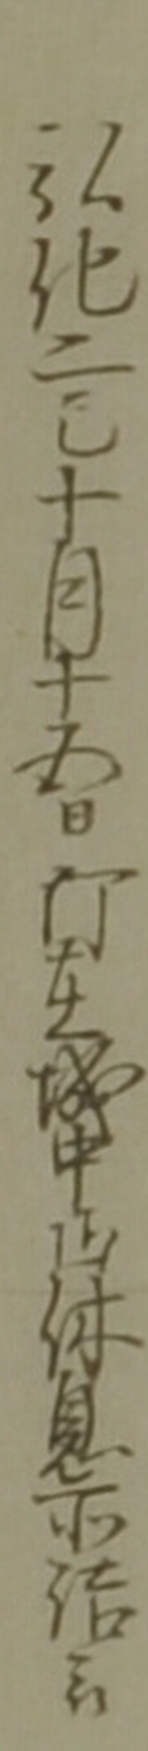一弘化二巳十月十五日御在城中御休息所詰被
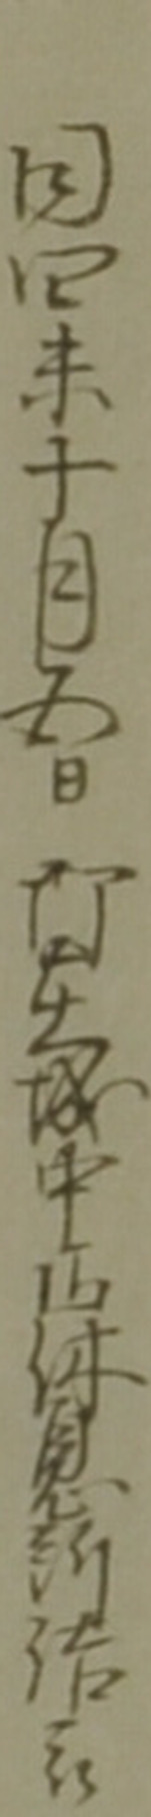一同四未十月五日御在城中御休息所詰被
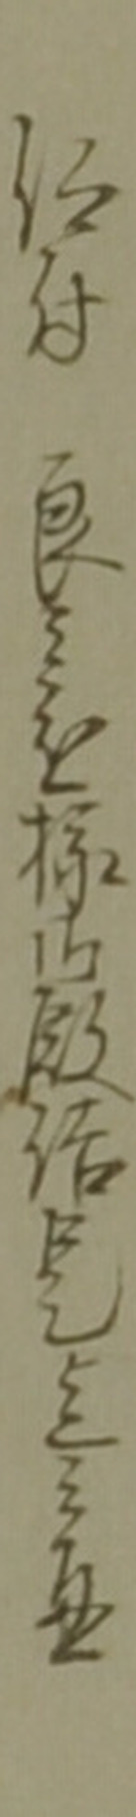仰付良之進様御殿詰是迄之通
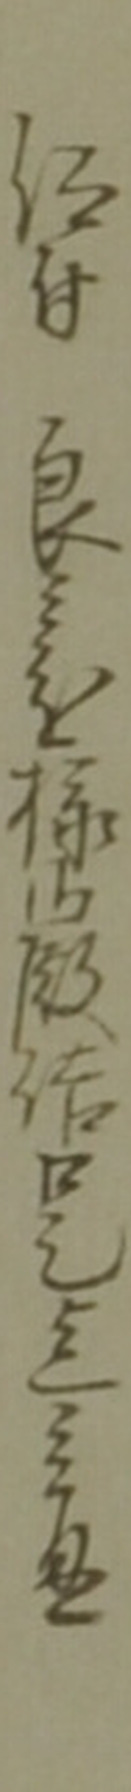仰付良之進様御殿詰是迄之通

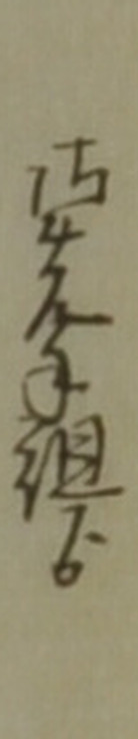御先手組ゟ
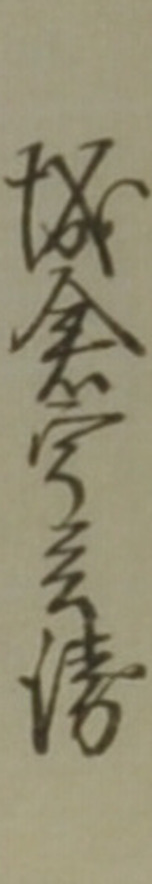城倉宇兵衛
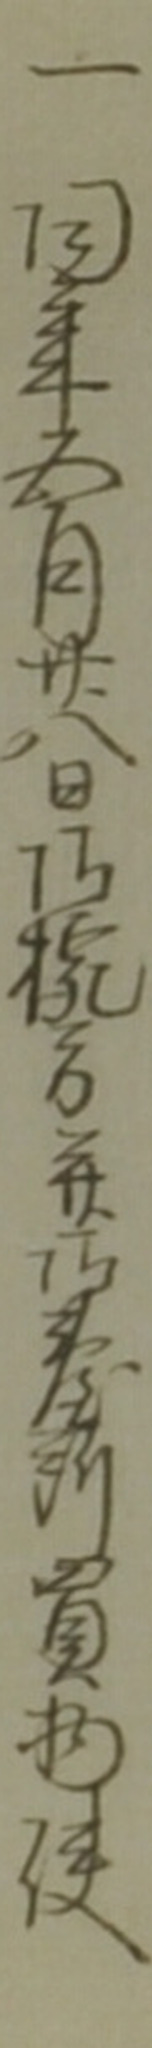一同年五月廿八日御椀方並御台所買物使
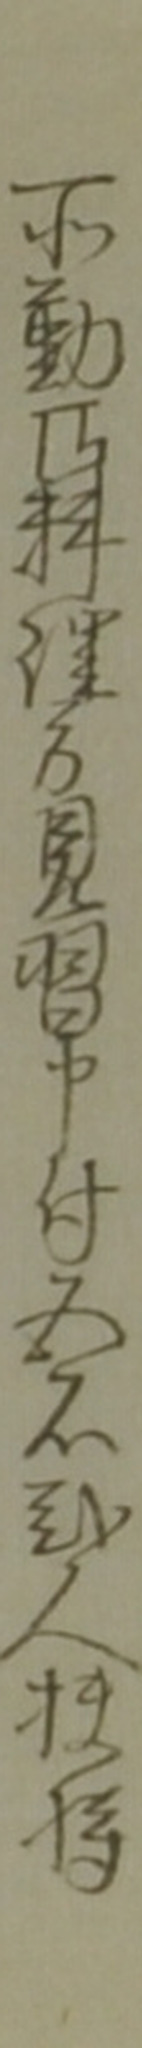所勤御料理方見習申付五石弐人扶持
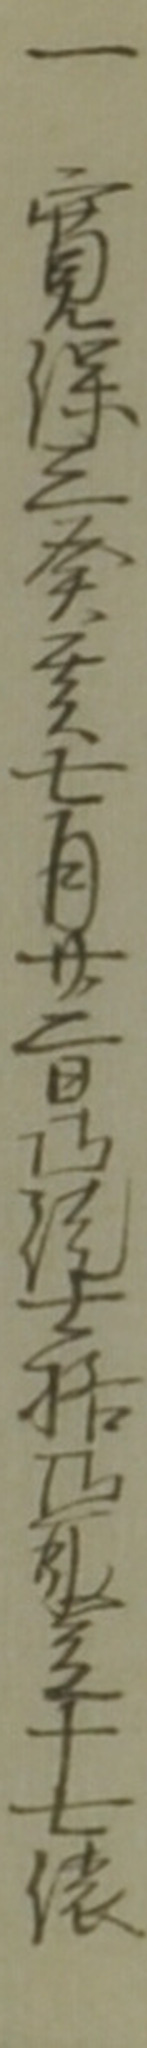一寛保三癸亥七月廿二日御徒士格御取立十七俵
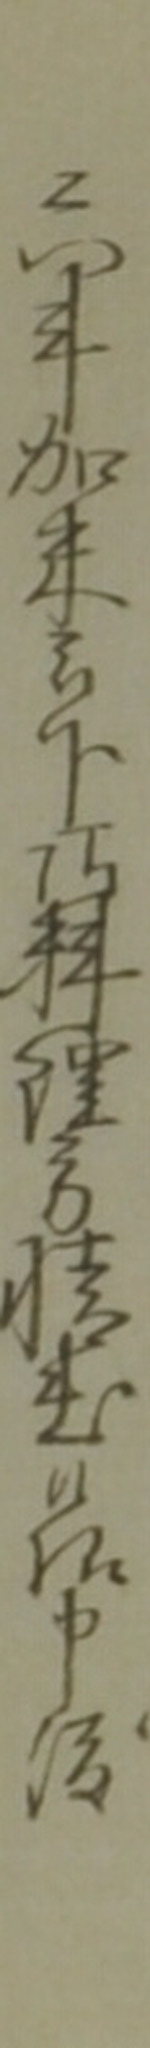六斗加来被下御料理方情出候様申渡
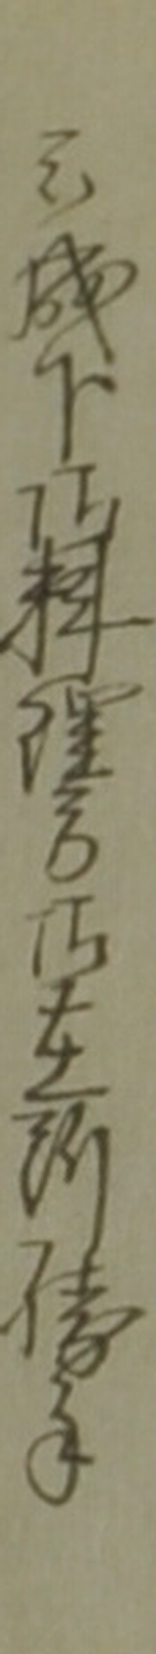被成下御料理方御在所勝手
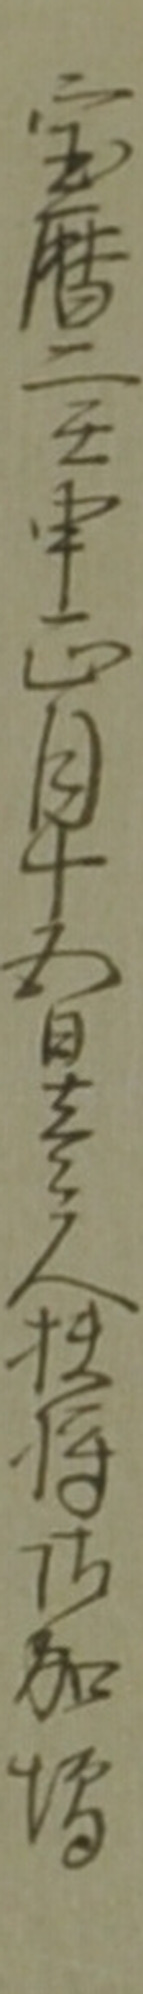一宝暦二壬申正月十五日壱人扶持御加増

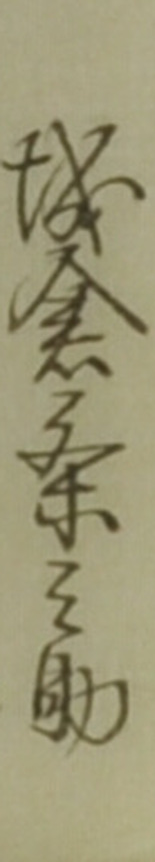城倉条之助
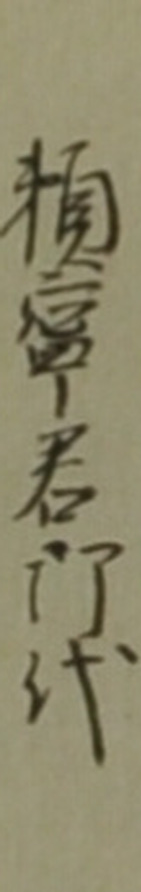頼寧君御代
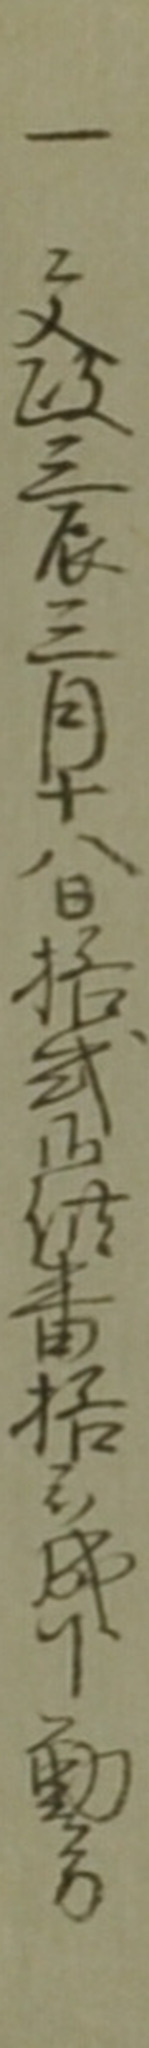一文政三辰三月十八日格式御供番格被成下勤方
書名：無足諸士勤仕録（五）
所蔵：伊那市立高遠町図書館・合同会社AMANE
